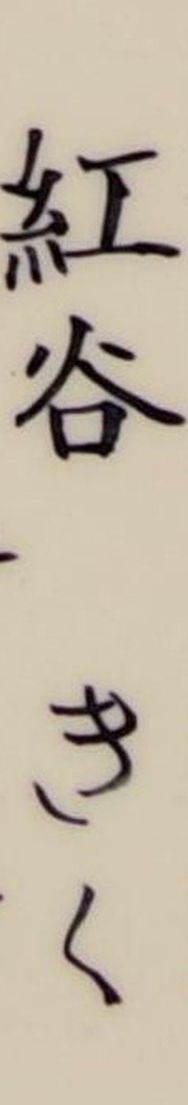紅谷きく
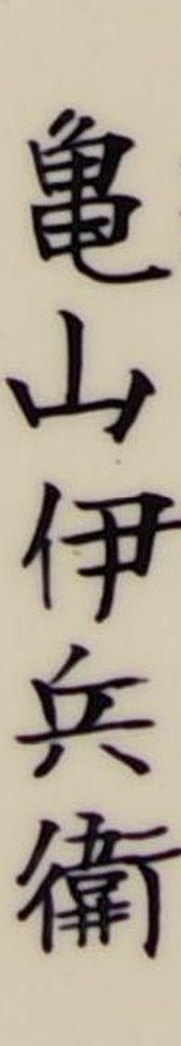亀山伊兵衛
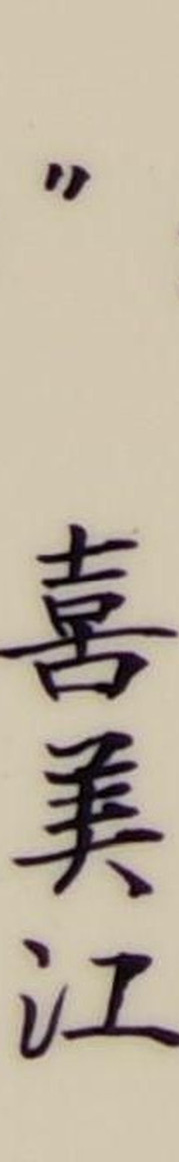喜美江
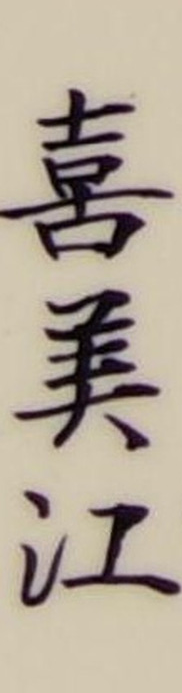喜美江
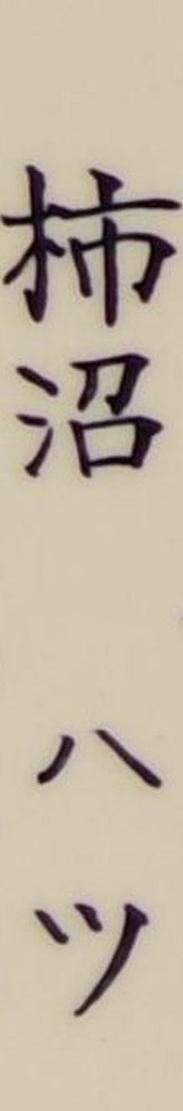柿沼ハツ
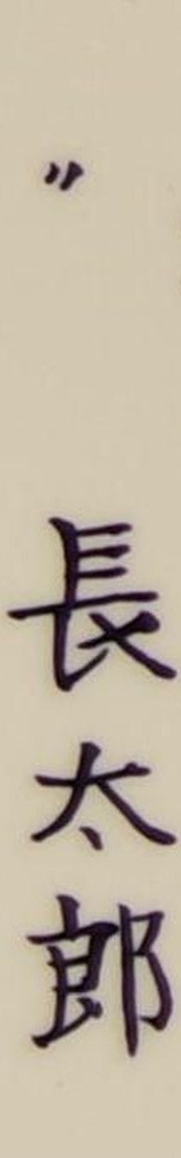長太郎
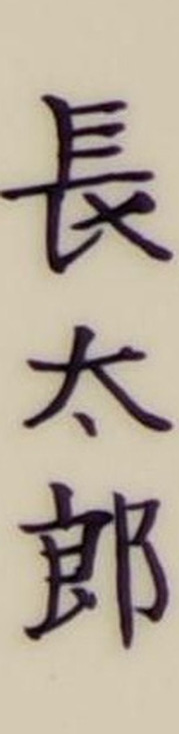長太郎

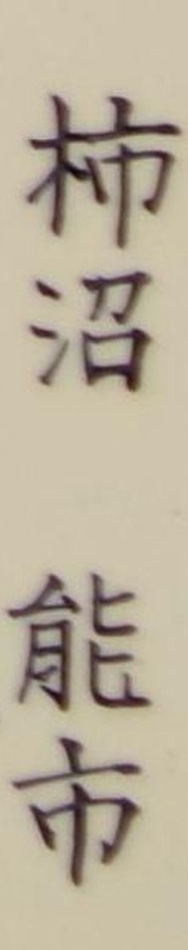柿沼能市
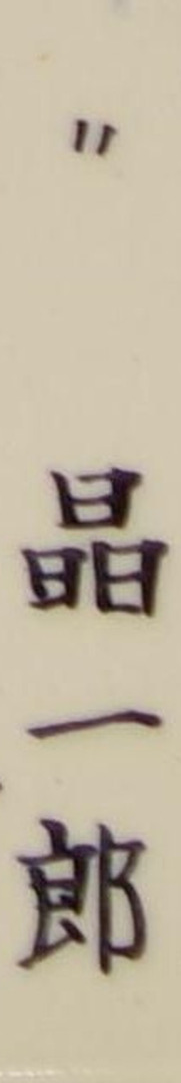晶一郎
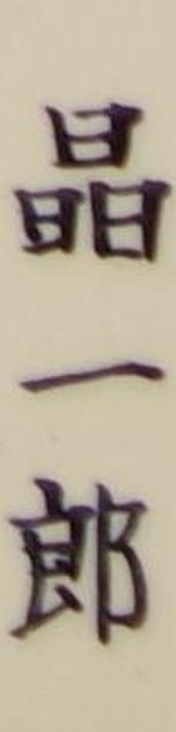晶一郎
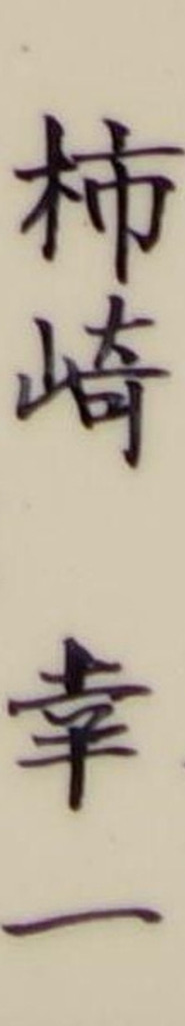柿崎幸一
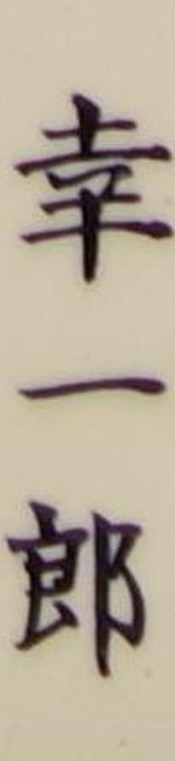幸一郎
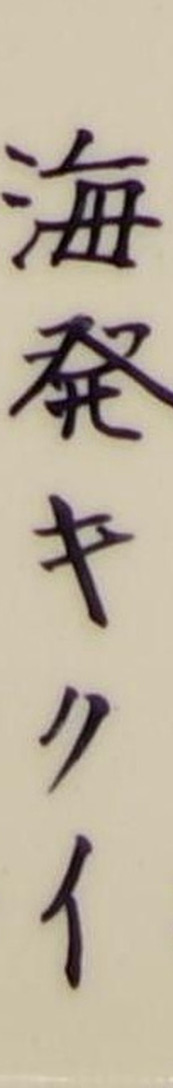海発キクイ
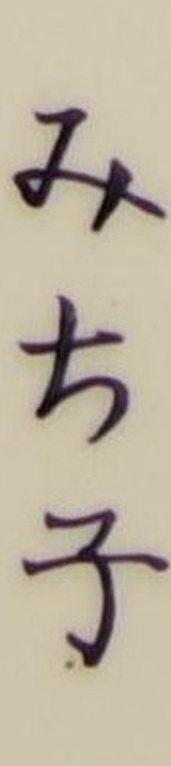みち子
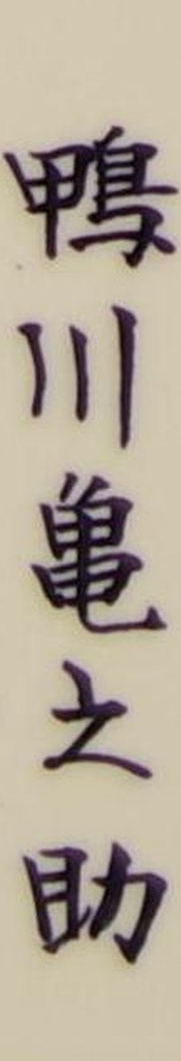鴨川亀之助
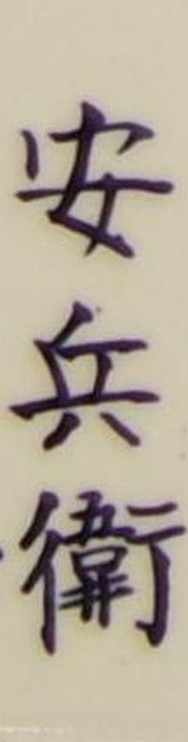安兵衛
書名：E~L
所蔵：高野山金剛峯寺
